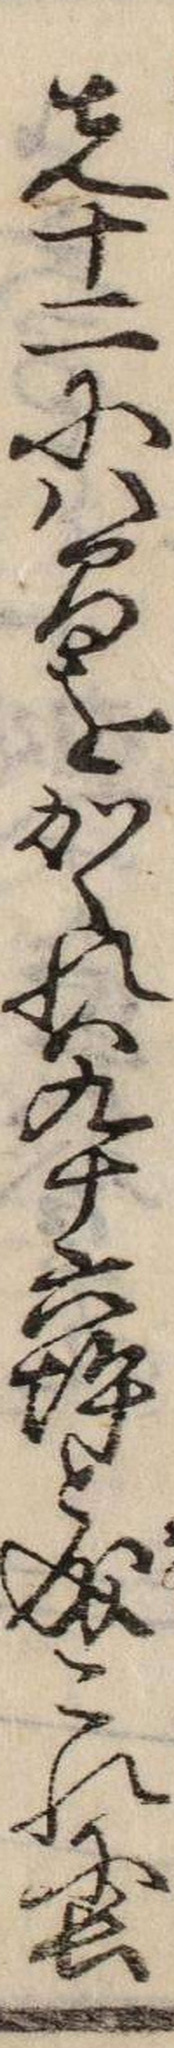先十二に八間をかくれは九十六坪と成これに長
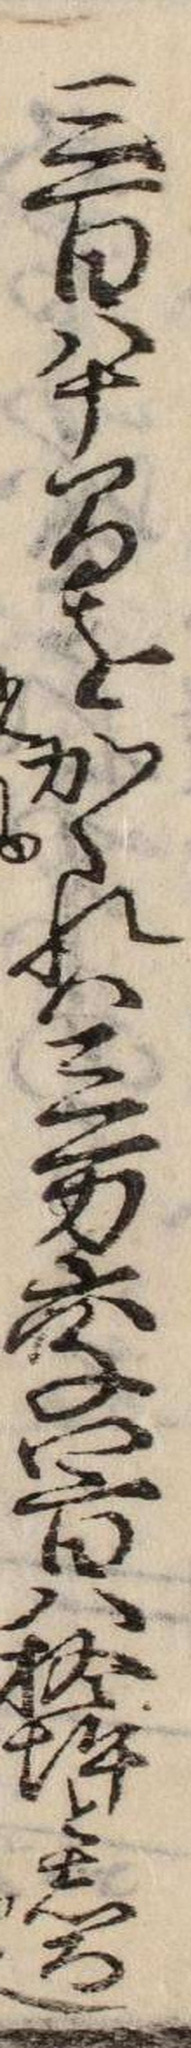三百八十間をかくれは三万六千四百八拾坪としる也
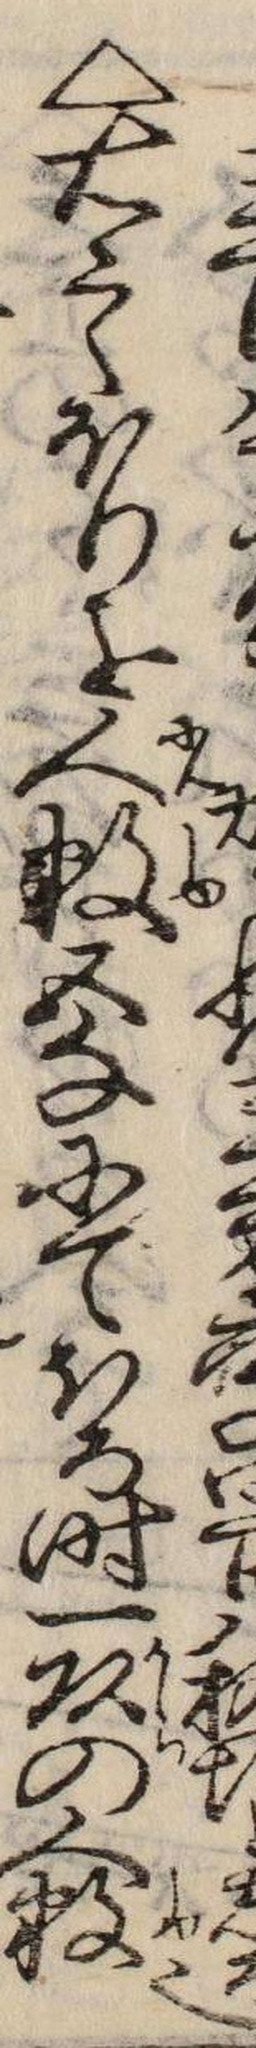△右之ほりを人数五千にてほる時一頭の人数
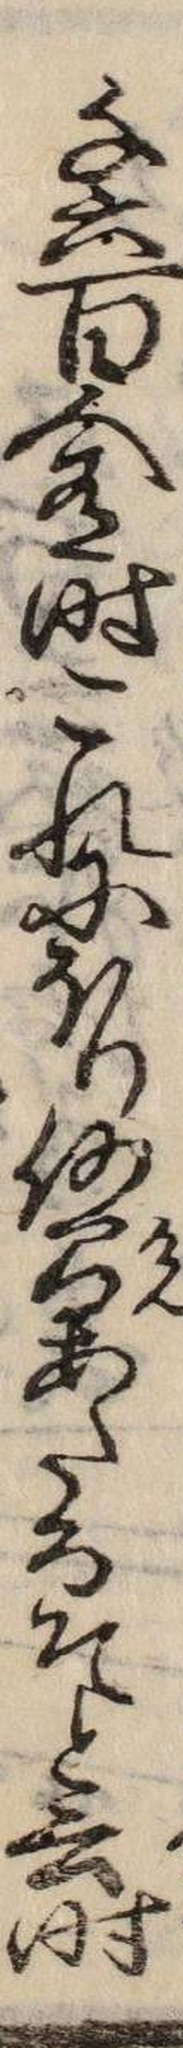千六百人有時これにほり何間あたるそと云時
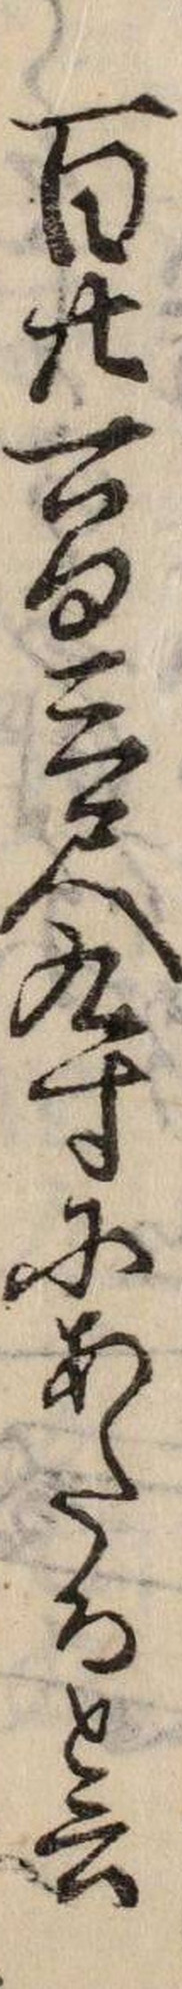百廿一間三尺九寸にあたると云
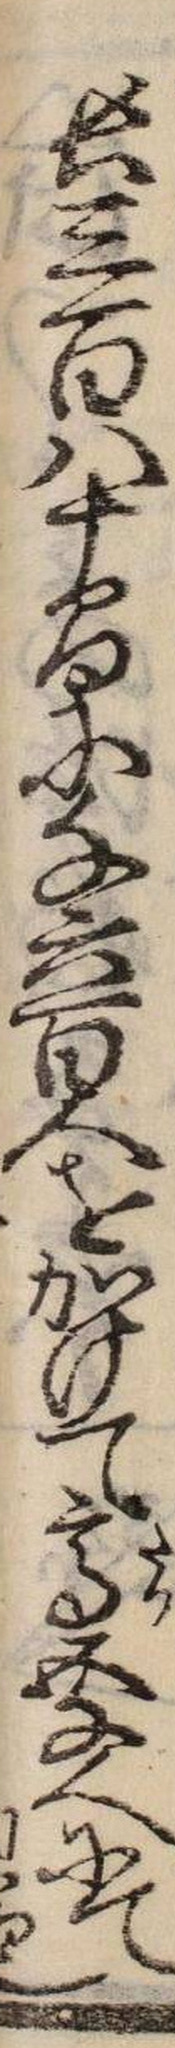長三百八十間に千六百人をかけて高五千人にてわる也
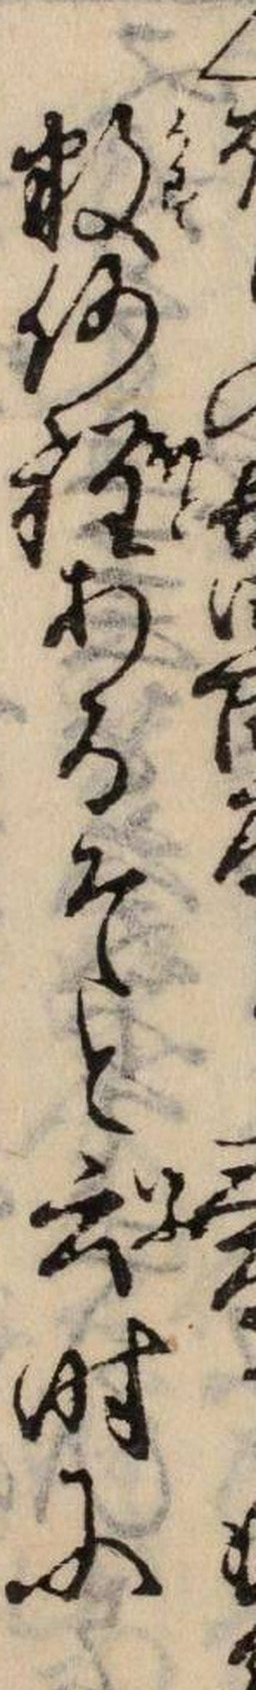数何程あるそと云時に
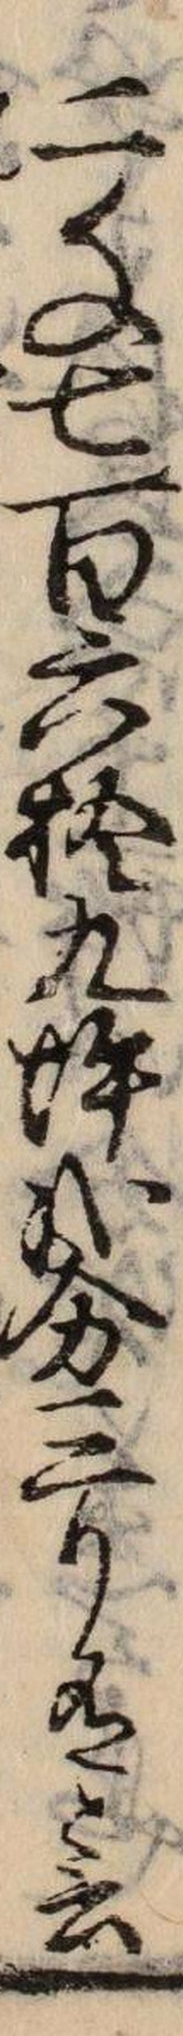二千七百六拾九坪弐分三り有と云
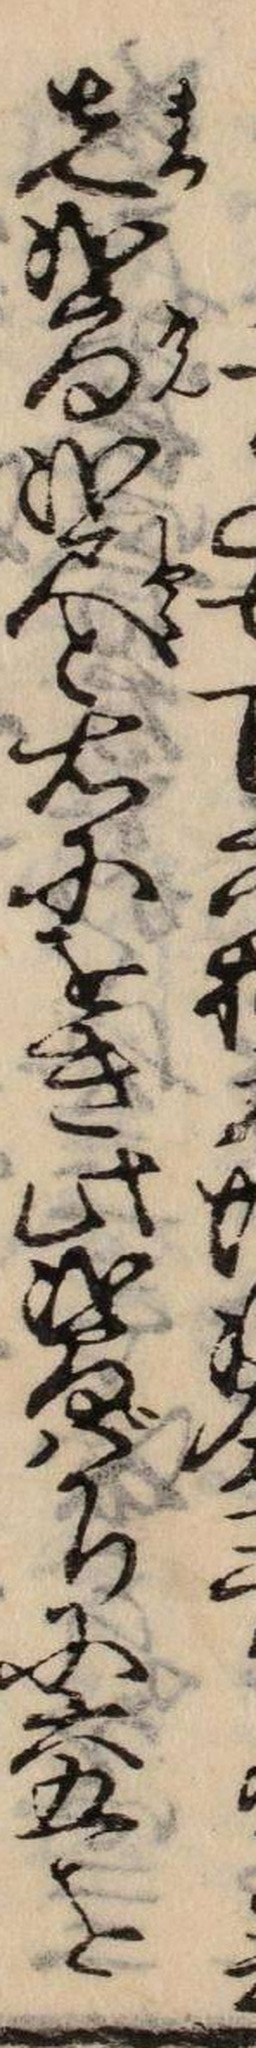先弐間弐尺と右にをき此弐間ばかりに六五を
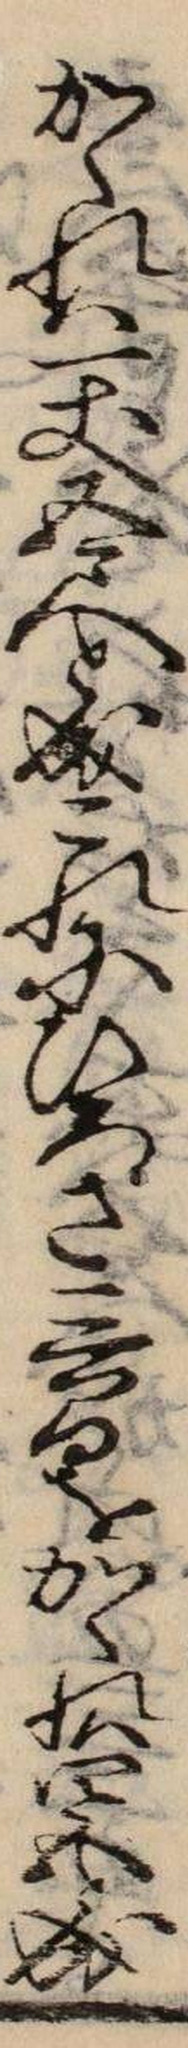かくれは一丈五尺と成これにひろさ三間をかくれは四五成
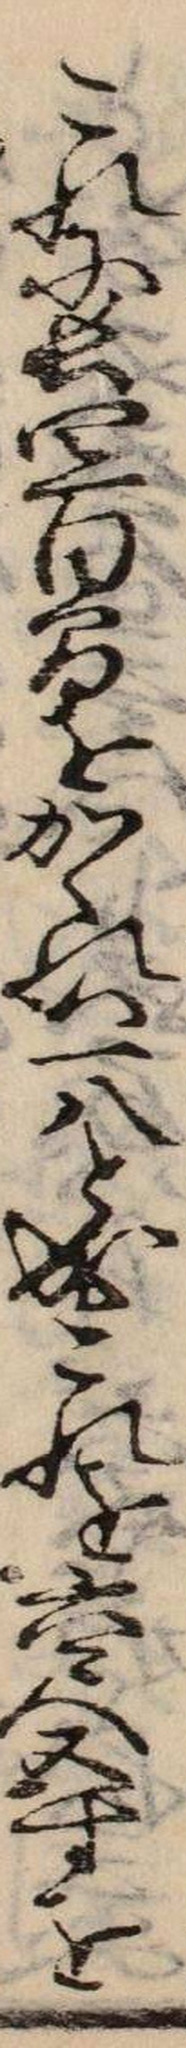これに長四百間をかくれは一八と成これを六尺五寸を
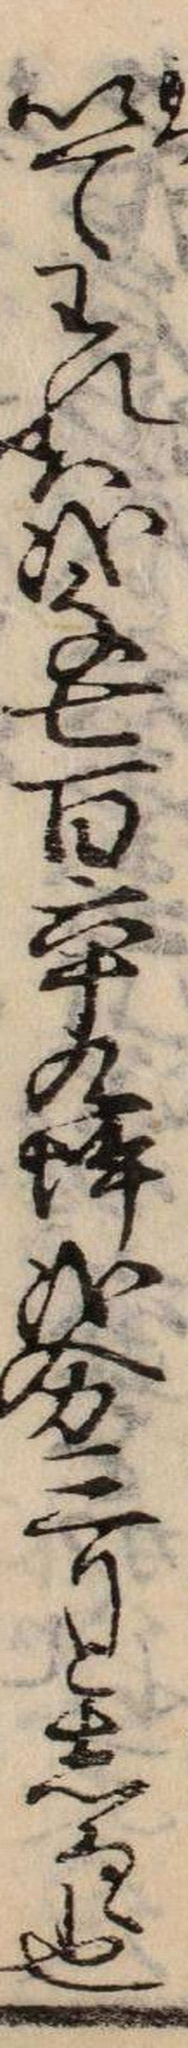以てわれは弐千七百六十九坪弐分三りとしるる也
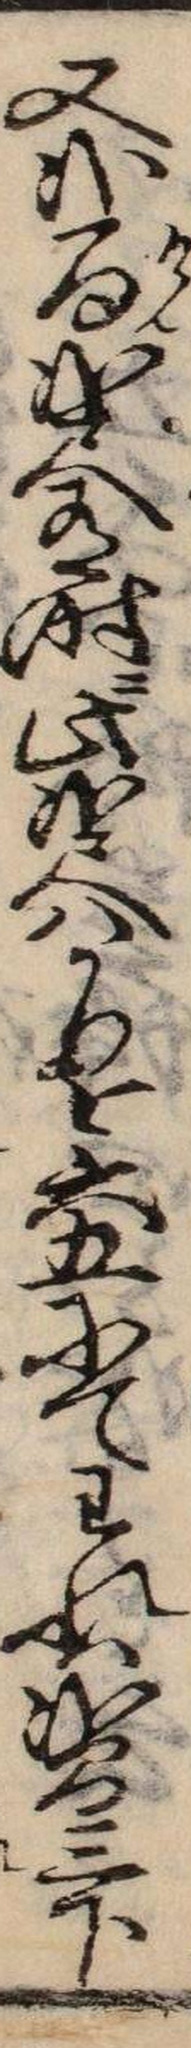又弐間弐人有時に此弐尺はかりを六五にてわれは弐間三下
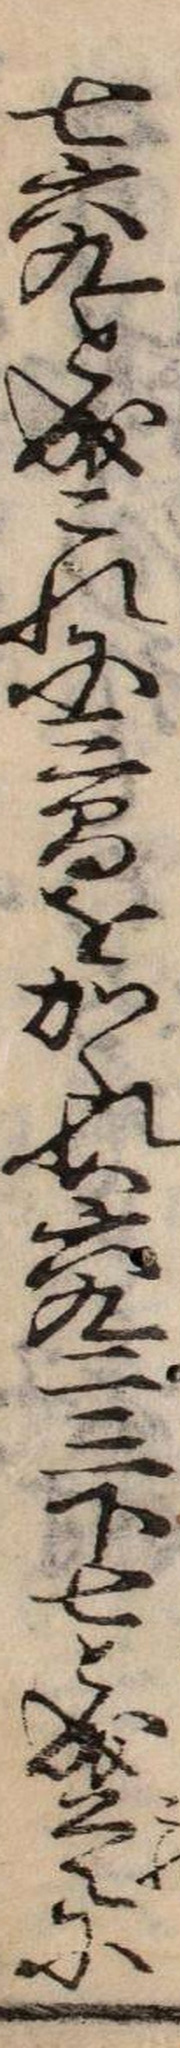七六九と成これに三間をかくれは六九二三下七と成是に
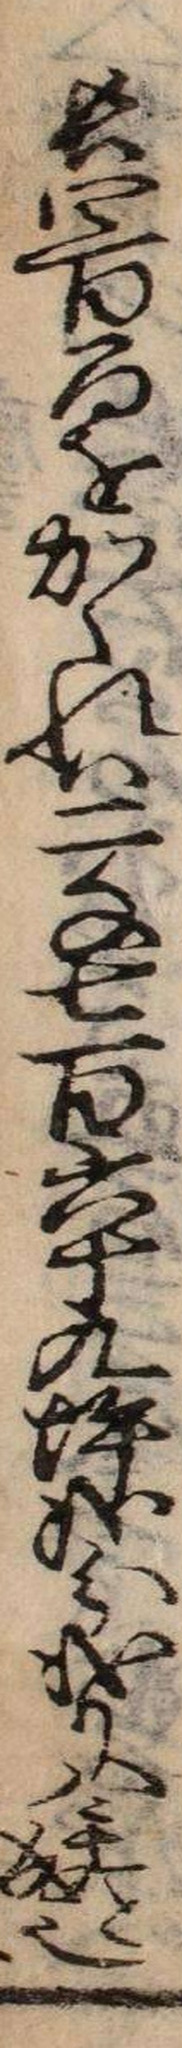長四百間をかくれは二千七百六十九坪弐分弐り八毛と成也

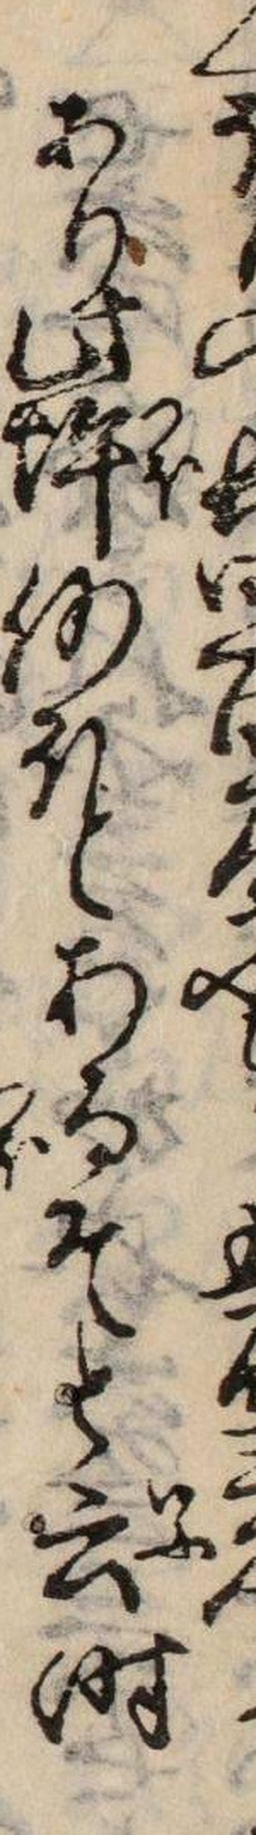あり此坪何ほとあるそと云時
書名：塵劫記（寛永11年自跋、京都府立京都学・歴彩館追貴8）
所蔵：京都府立京都学・歴彩館 国文学研究資料館
